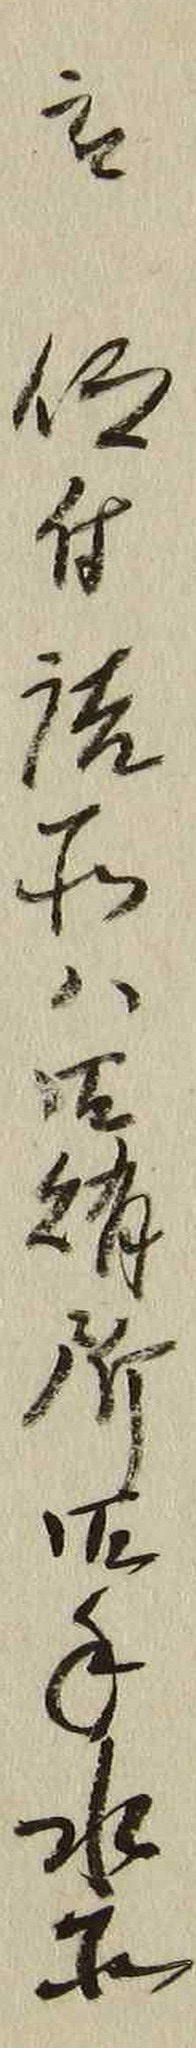被仰付詰所ハ御賄所御手水所
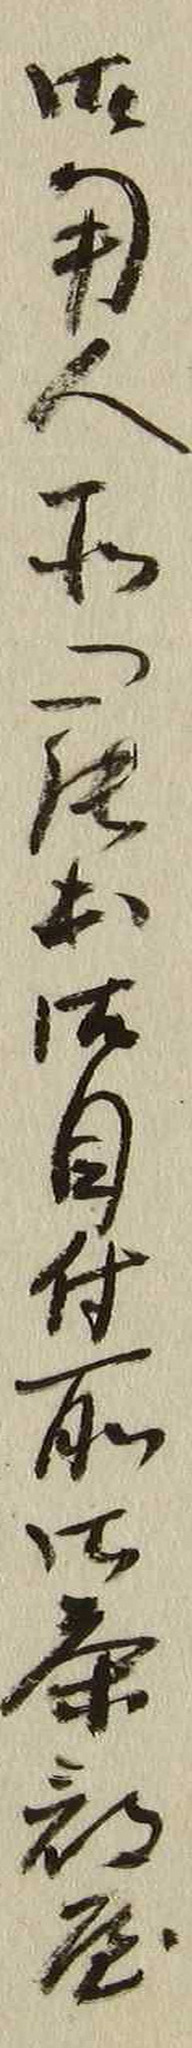御用人所へ罷出御目付所御茶部屋
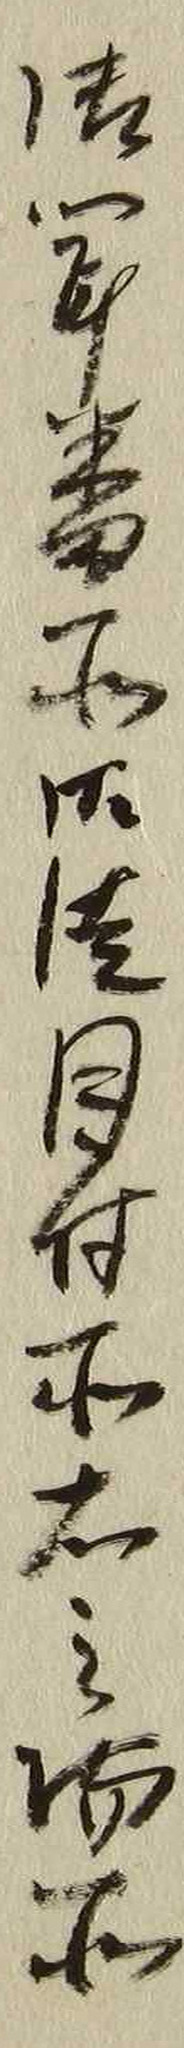御聞番所御徒目付所右之場所
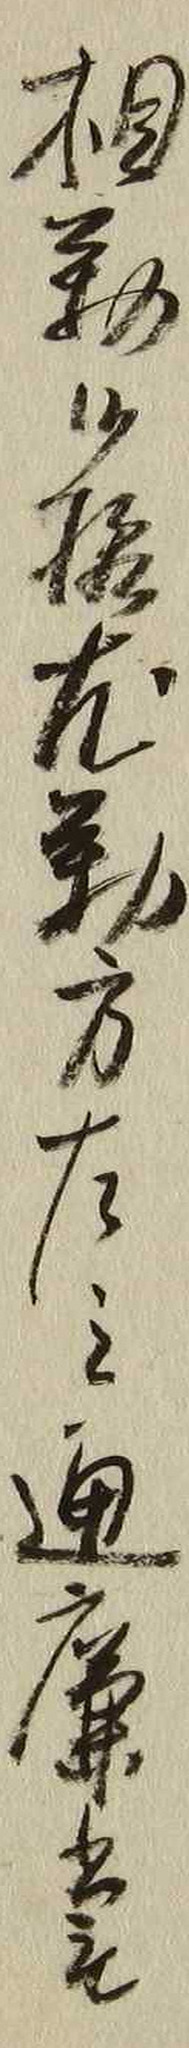相勤候様尤勤方左之通廉書被
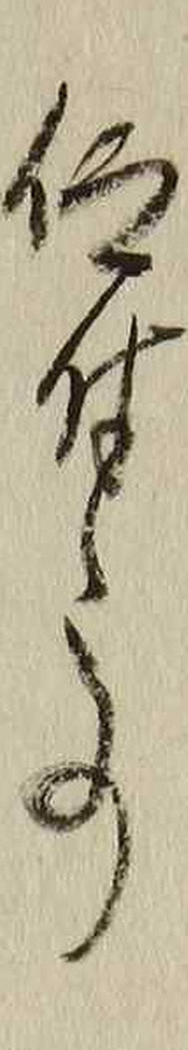仰付候事
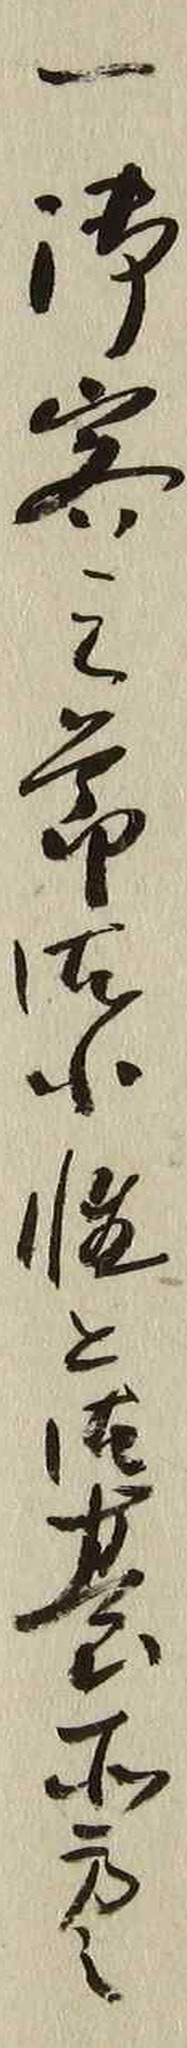一御客之節御小性と御台所方之
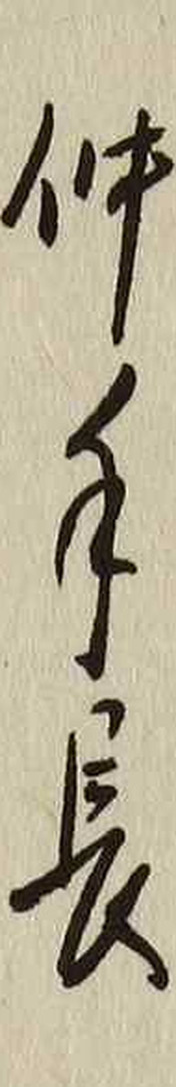仲手長
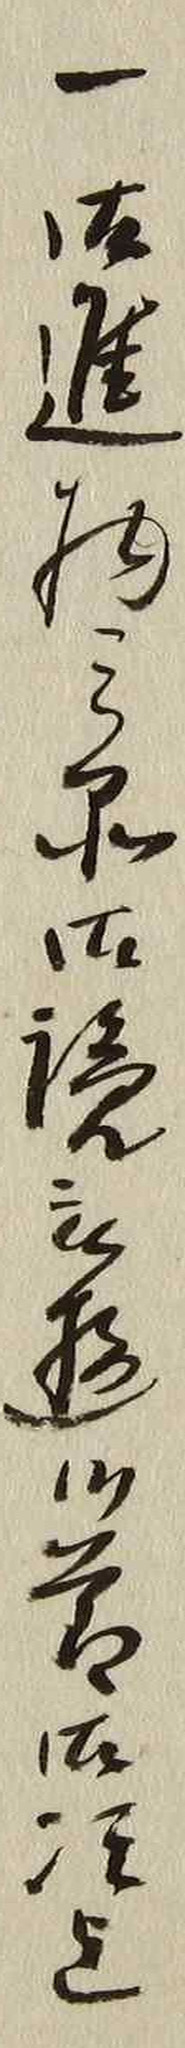一御進物之品御覧被遊候節御次迄
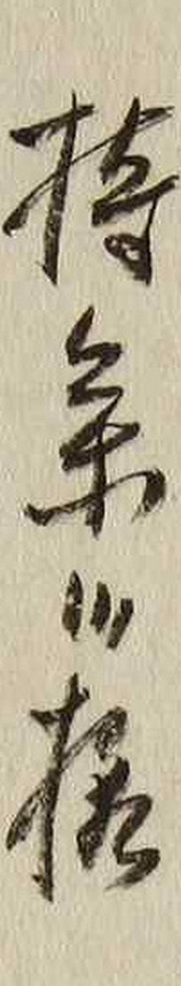持参候様
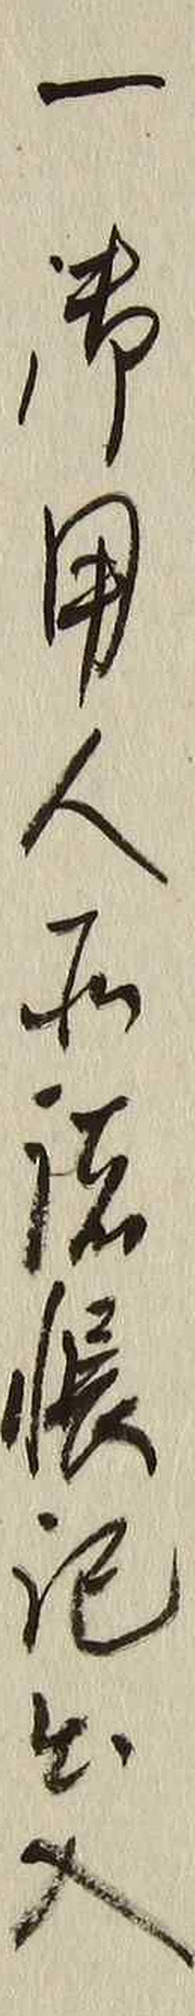一御用人所諸帳記出入
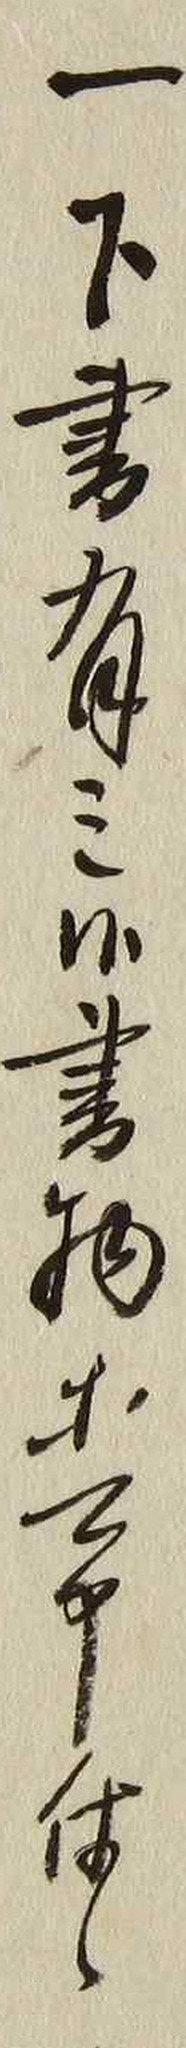一下書有之候書物等可申付候
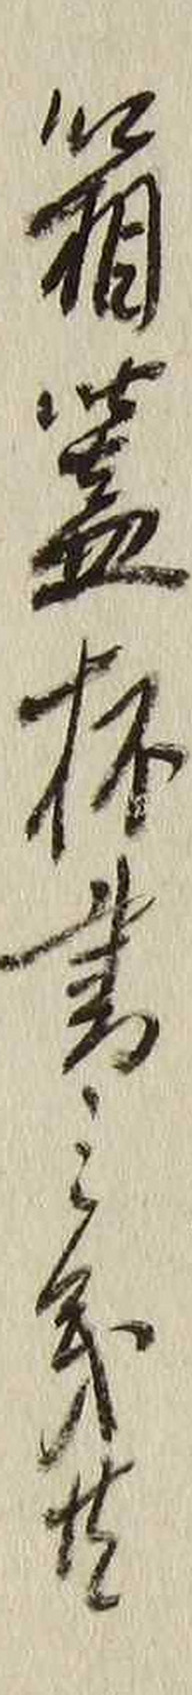箱蓋抔書之義共
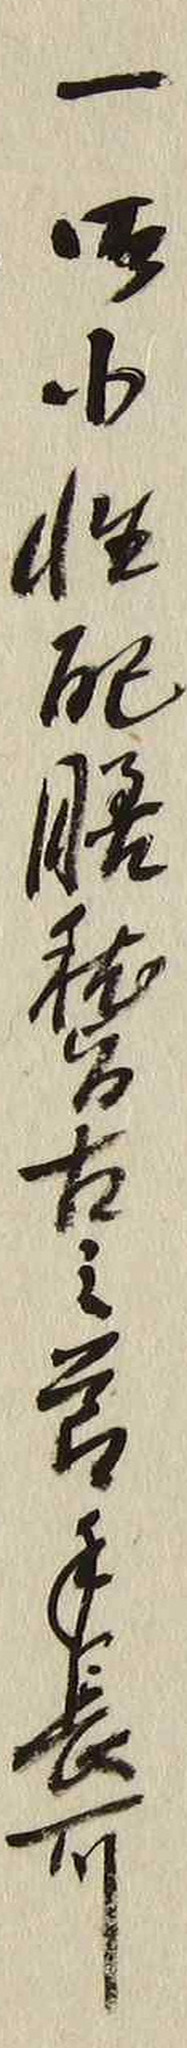一御小性配膳稽古之節手長可
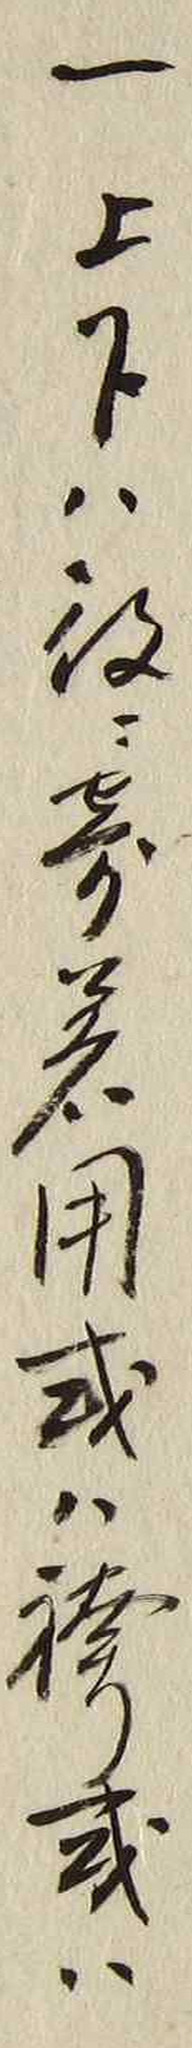一上下ハ役ニ寄着用或ハ袴或ハ
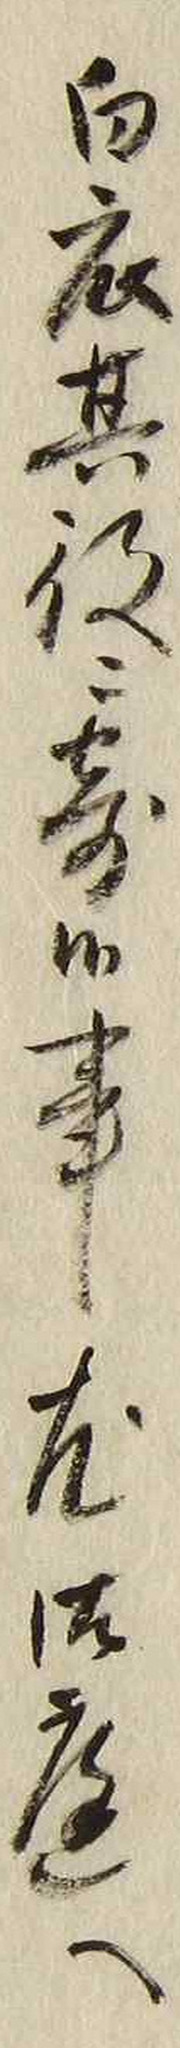白衣其役ニ寄候事尤御庭へ

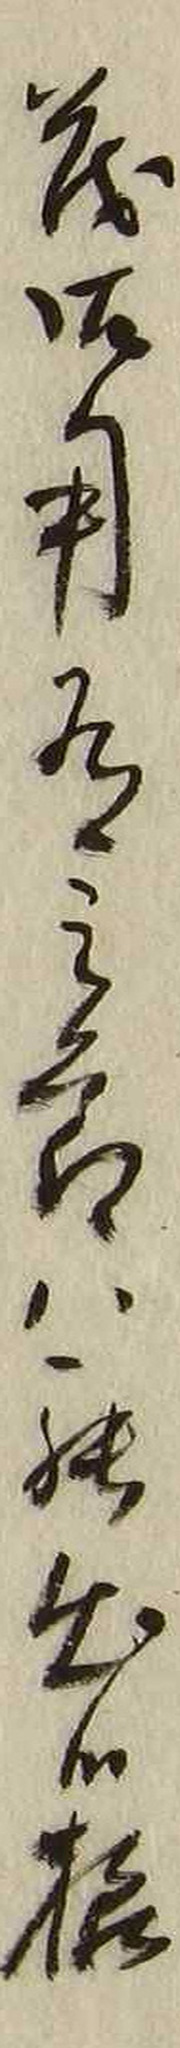も御用有之節ハ罷出候様
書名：諸士系譜　巻之353　す之部3
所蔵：会津若松市立会津図書館
